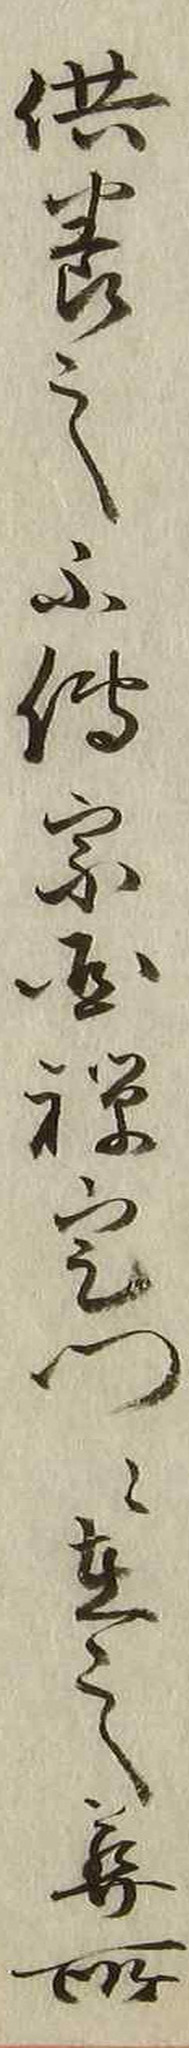供養之不伝宗国禅定門ニ在之葬所
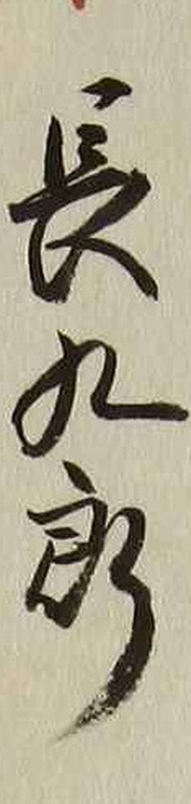長九郎
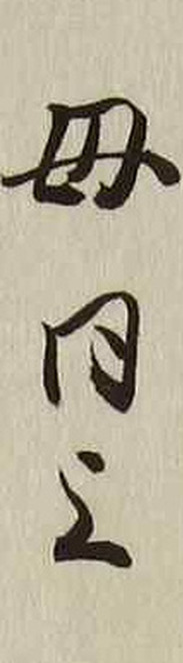母同上
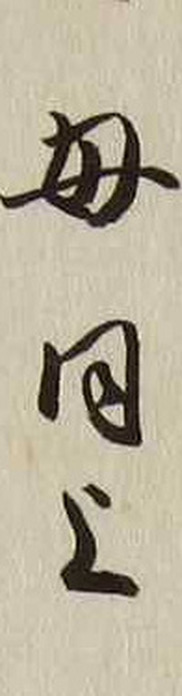母同上
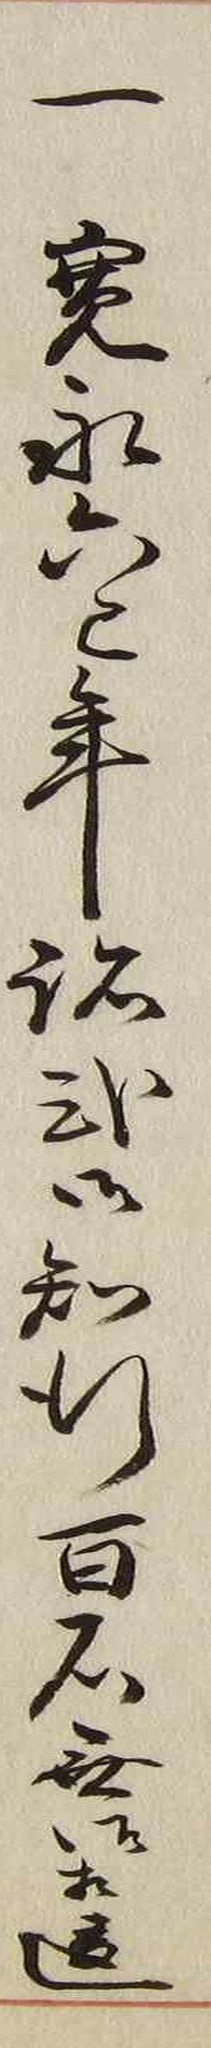一寛永六巳年跡弐御知行百石無御相違
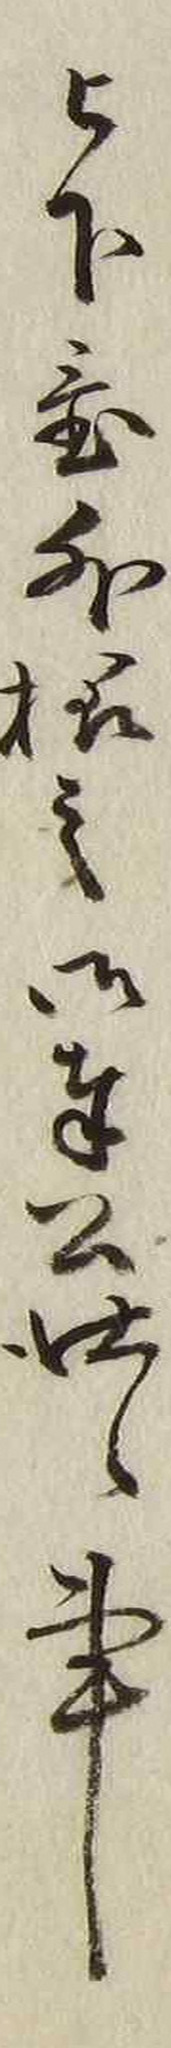被下置外様之御奉公仕候事
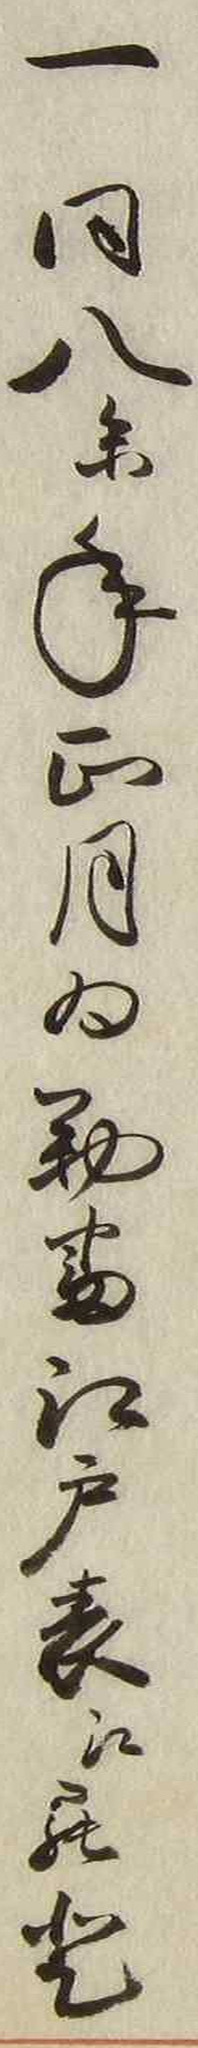一同八未年正月為勤番江戸表江罷登
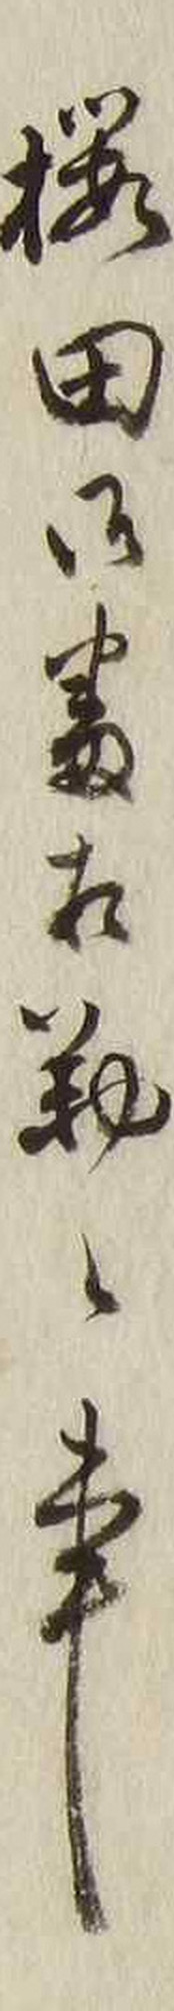桜田御番相勤候事

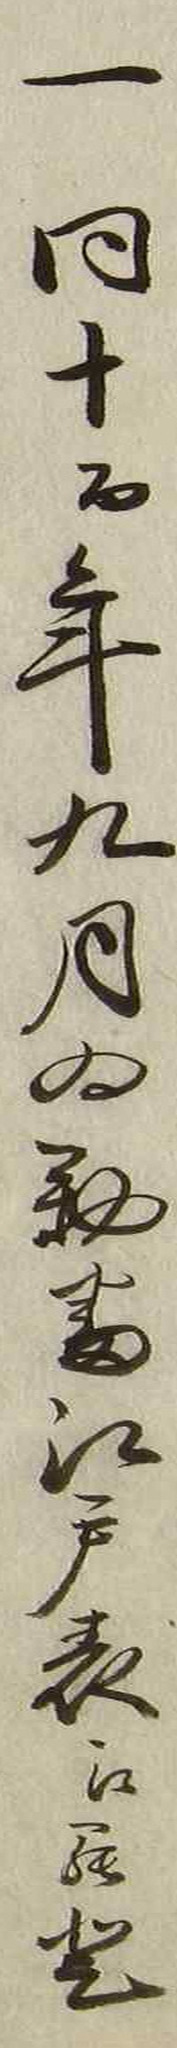一同十酉年九月為勤番江戸表江罷登
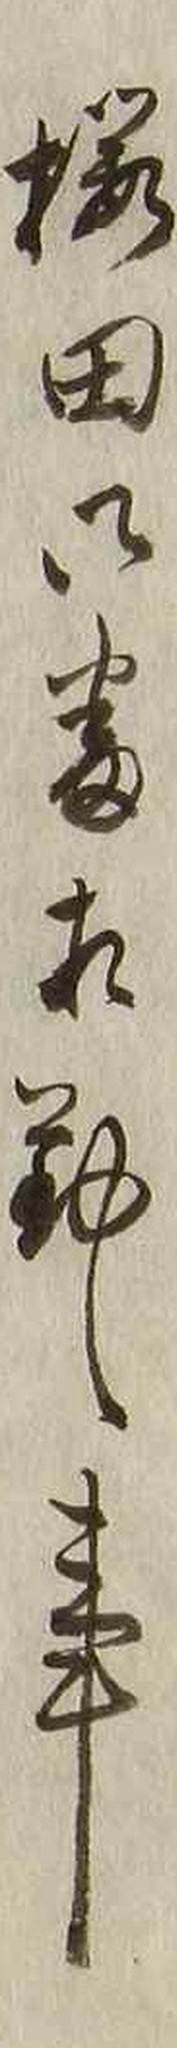桜田御番相候事
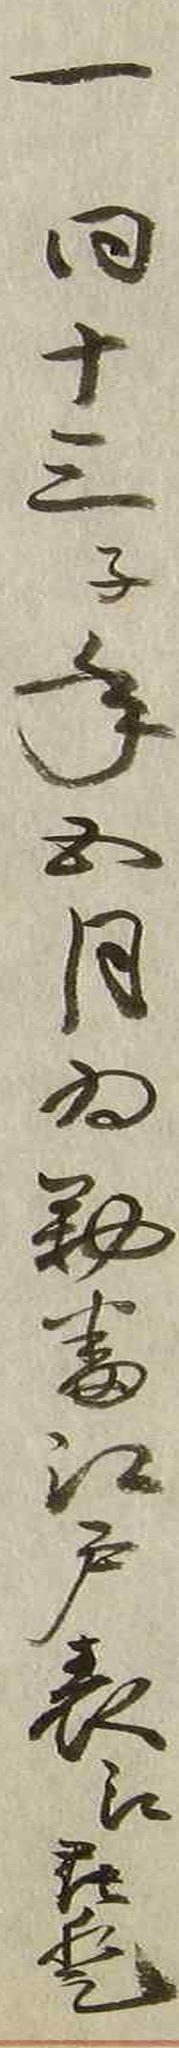一同十三子年五月為勤番江戸表江登
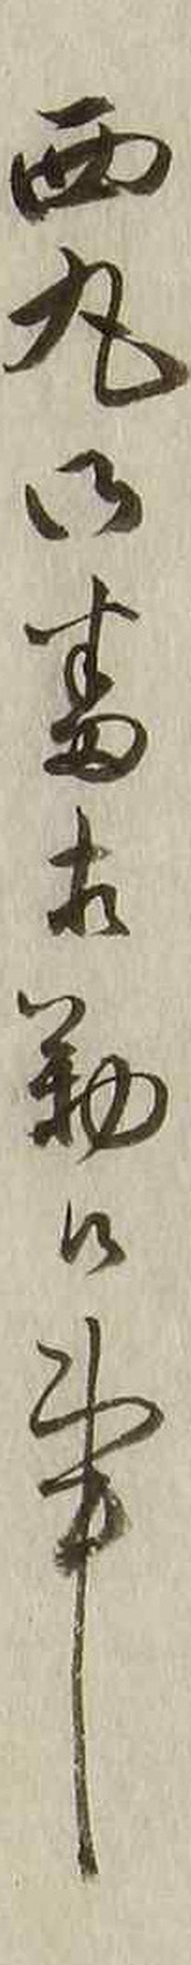西丸御番相勤候事
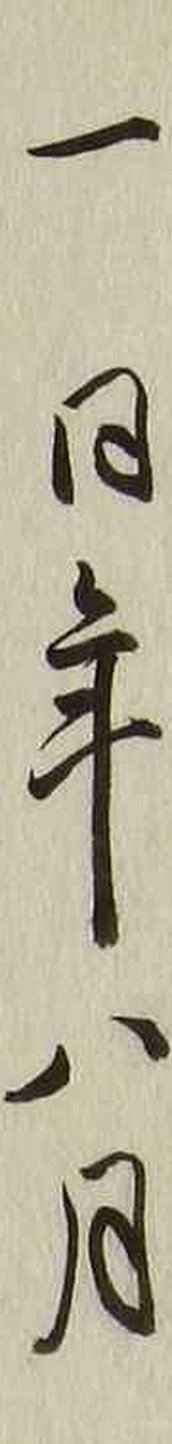一同年八月
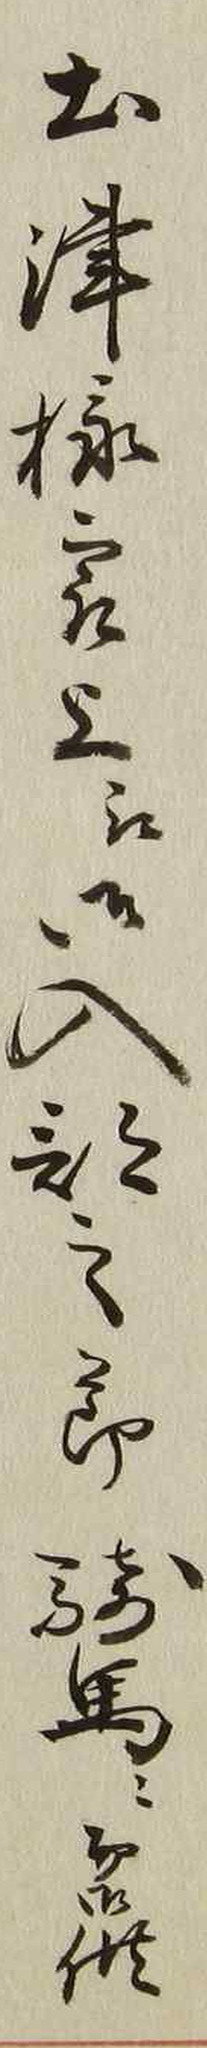土津様最上江御入部之節騎馬ニ而御供
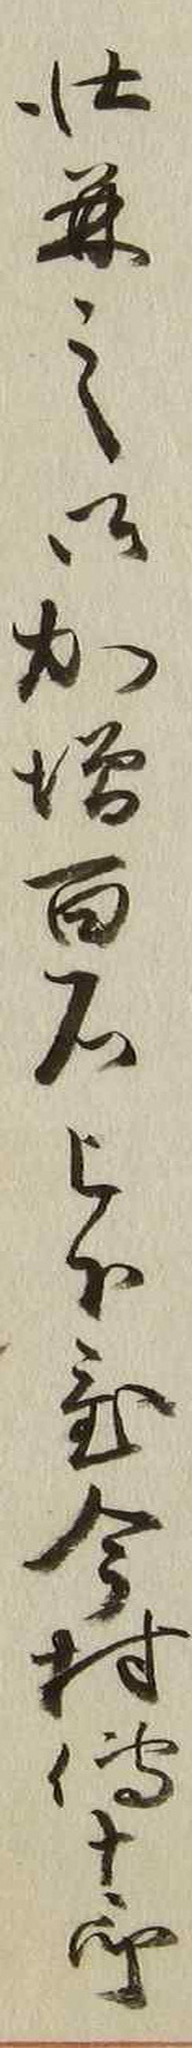仕並之御加増百石被下置今村伝十郎
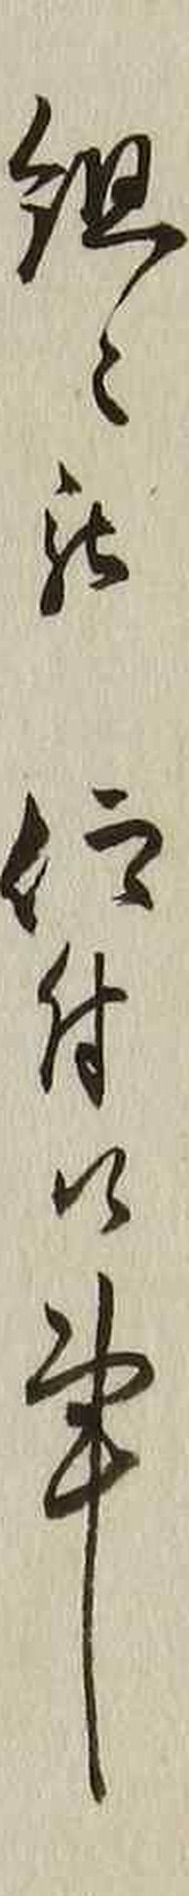組ニ被仰付候事
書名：諸士系譜　巻之15　い之部15
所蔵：会津若松市立会津図書館
